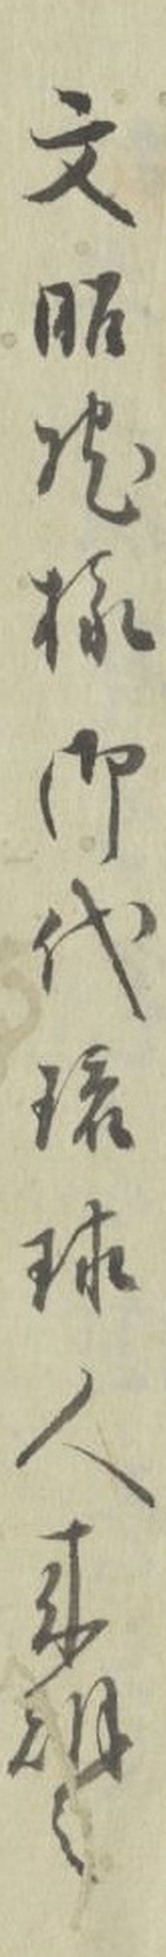文昭院様御代琉球人来朝之
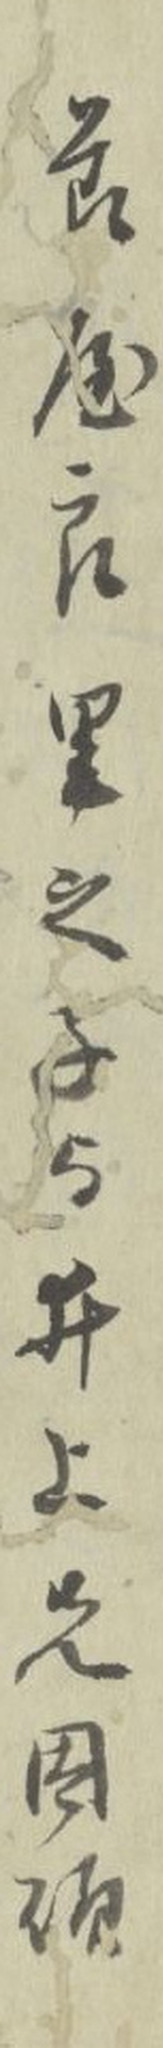節屋良里之子と井上先因硯
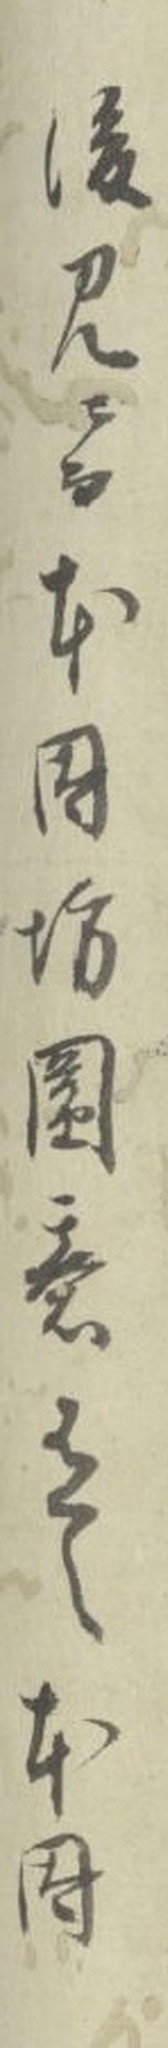後見に而本因坊囲碁有之本因
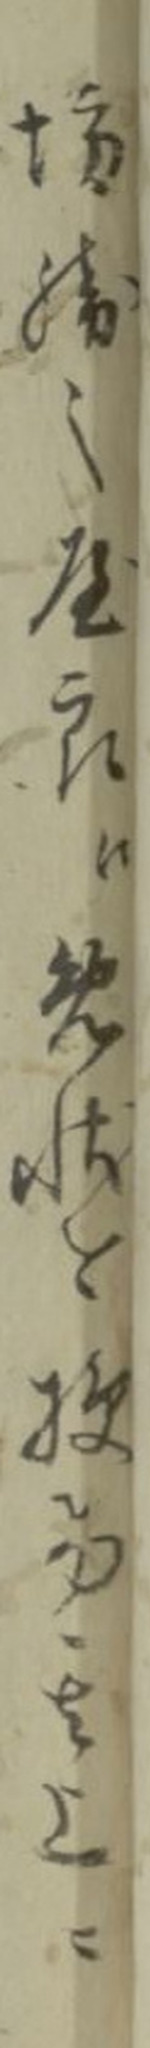坊勝之屋良え免状を授け其上に
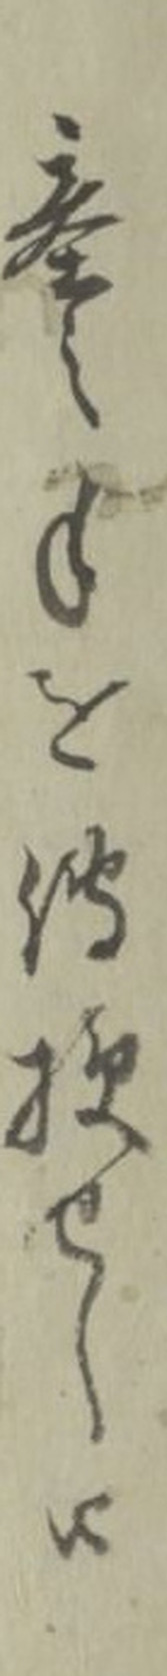碁之手を伝授せしや
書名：琉球来朝記 自八至十四終
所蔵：University of the Ryukyus Library
